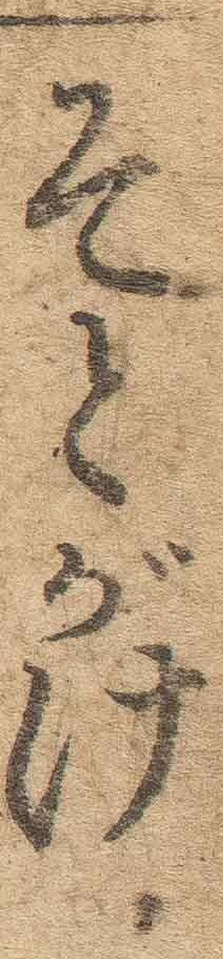そとがけ
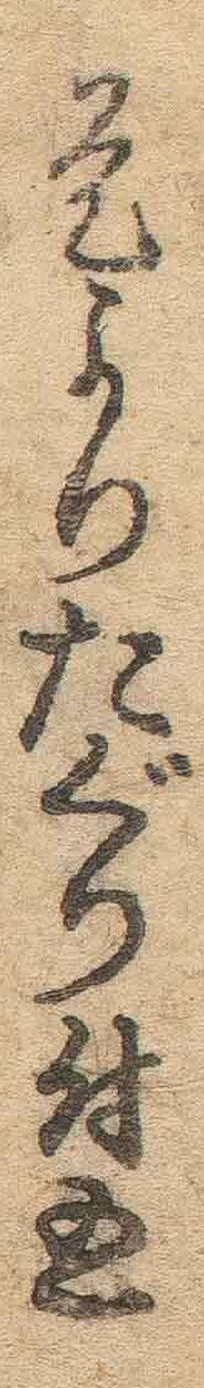是よりたぐり付出
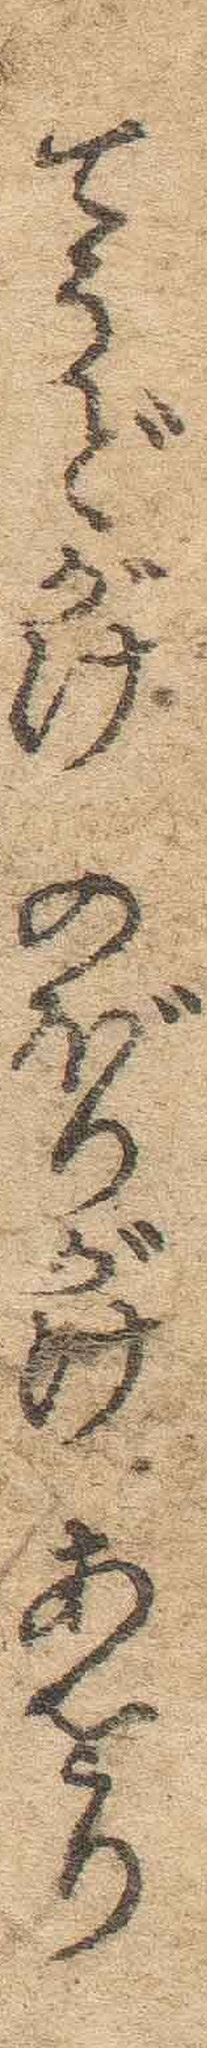てうどがけのぼりがけあをり
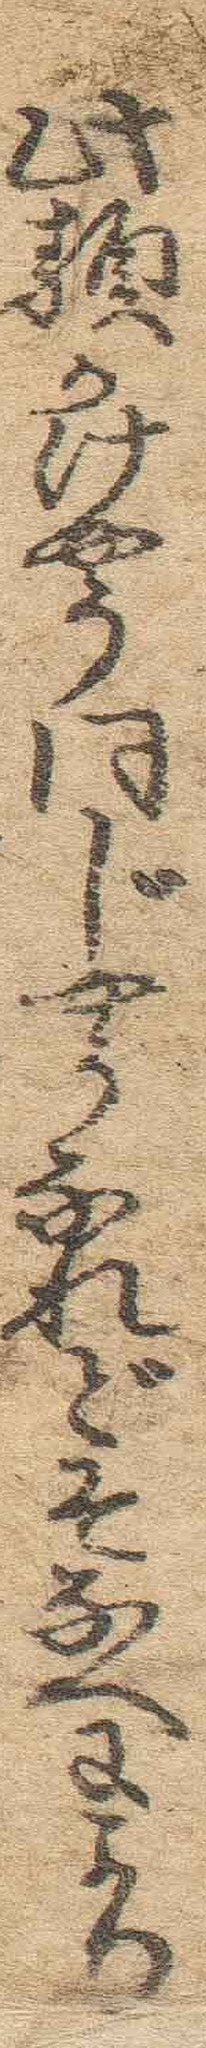此類かけやう同じやうなれどそなへにより
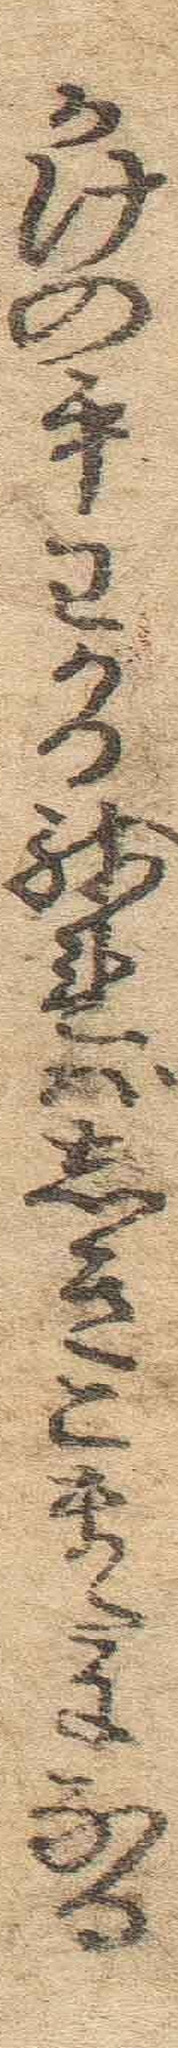かけの手わける残ればしきこまたになる
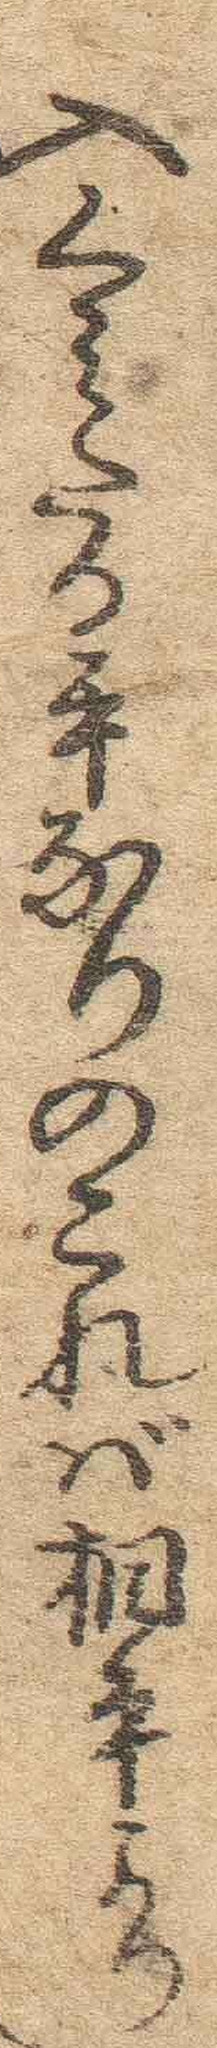入くみたる手なりのこれば相手より
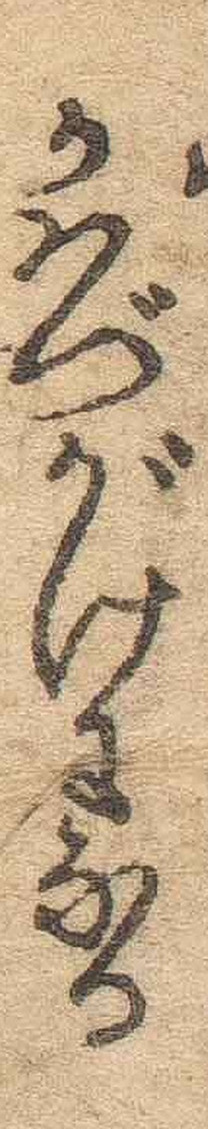かはづがけになる
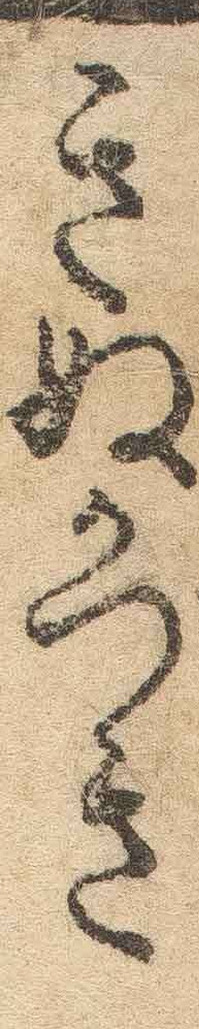きぬかづき
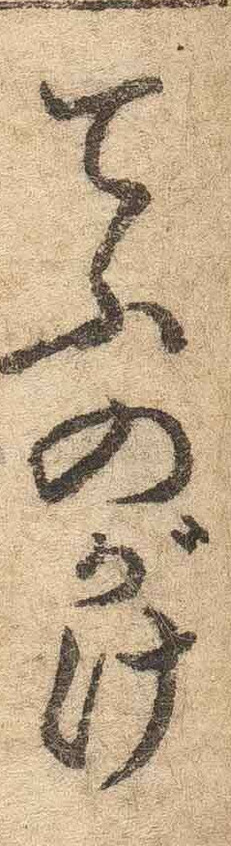てふのがけ
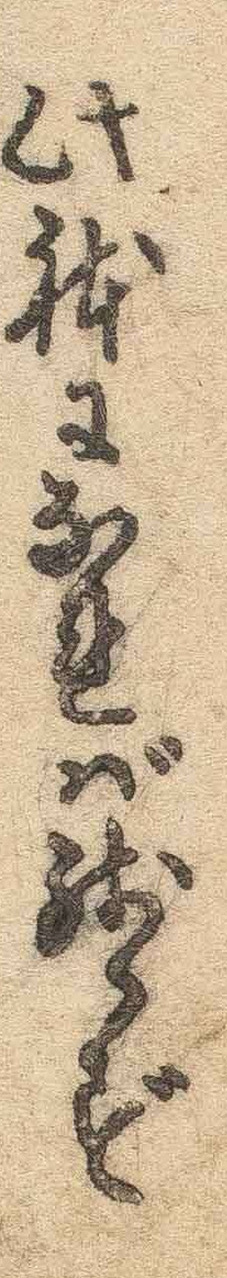此体になれば残らず
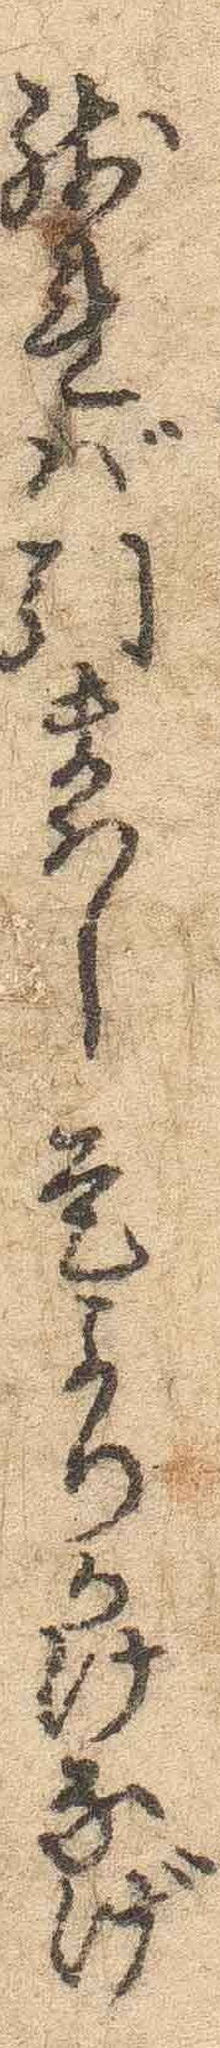残れば引まはし是よりかけなげ
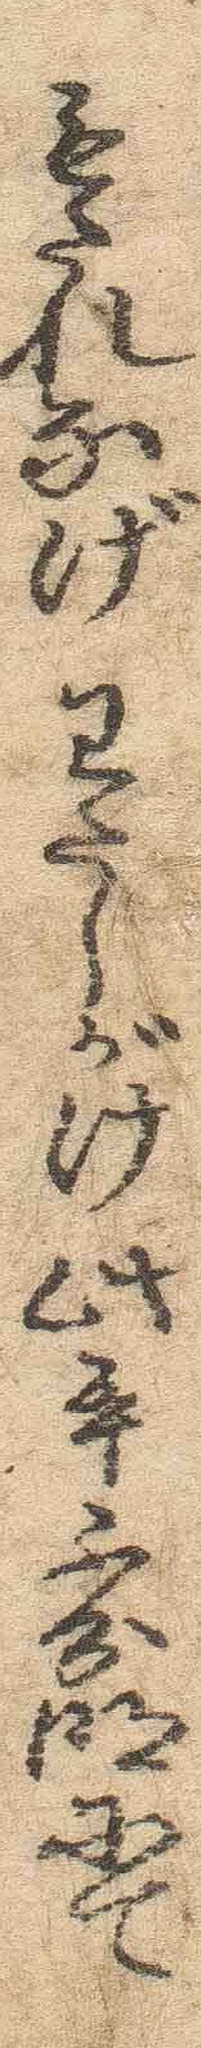もたれなげわたしがけ此手不分明にて
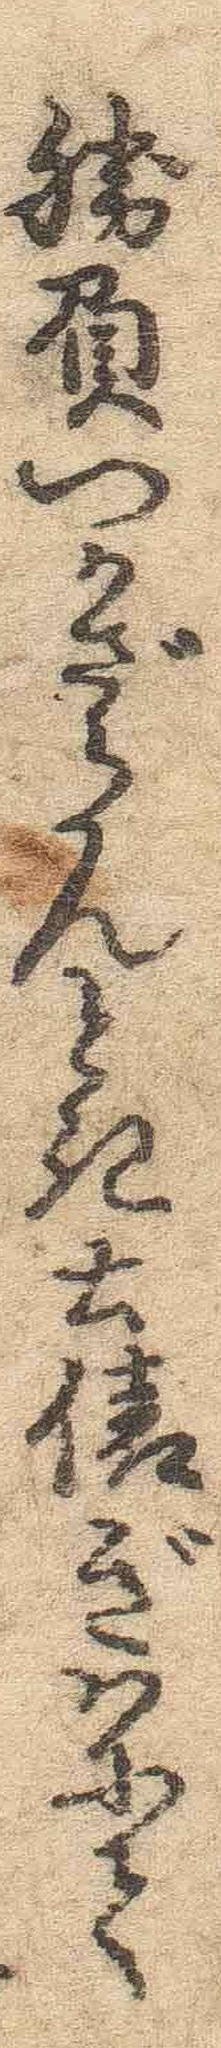勝負つかざらんとき土俵ぎはにて
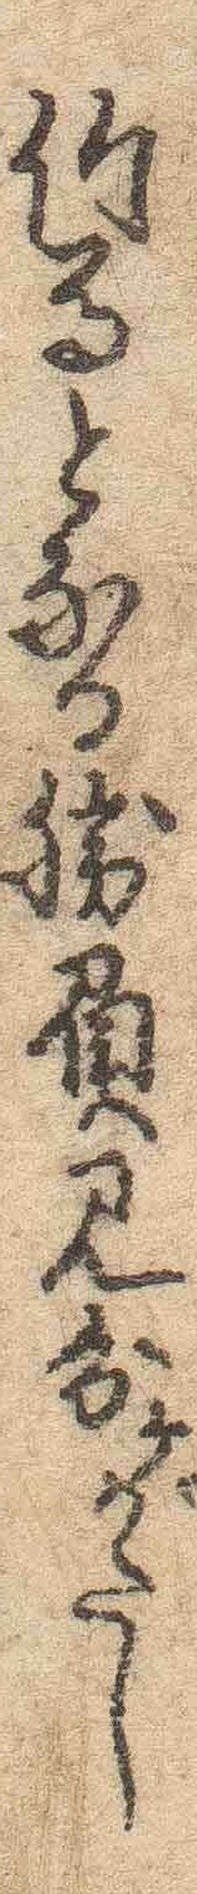竹馬となる勝負見分ヶがたし

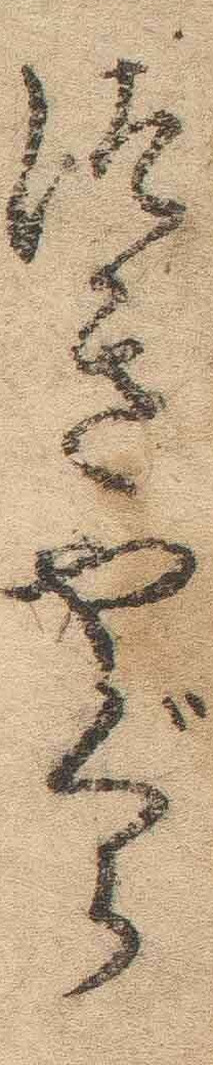つきやぐら
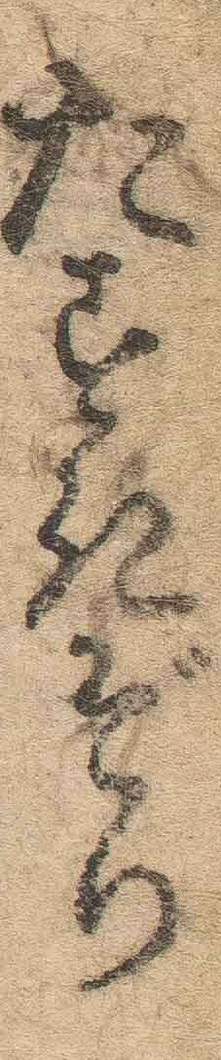たすきぞり
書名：古今相撲大全
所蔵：東京学芸大学附属図書館 国文学研究資料館
